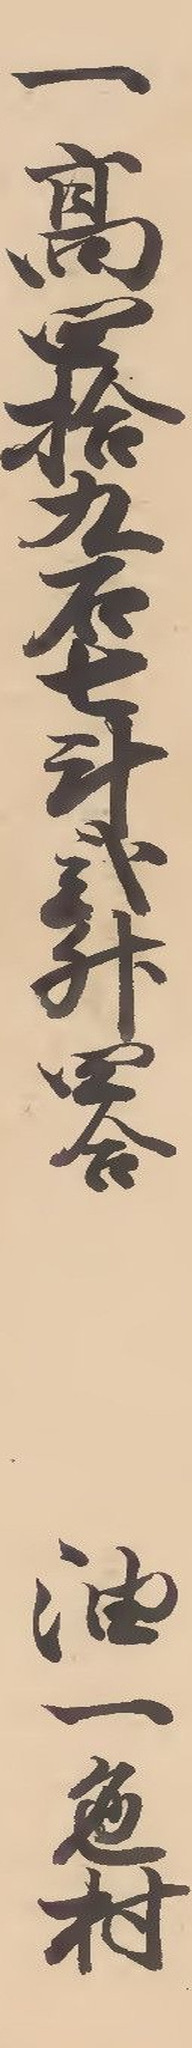一高四拾九石七斗弐升四合油一色村
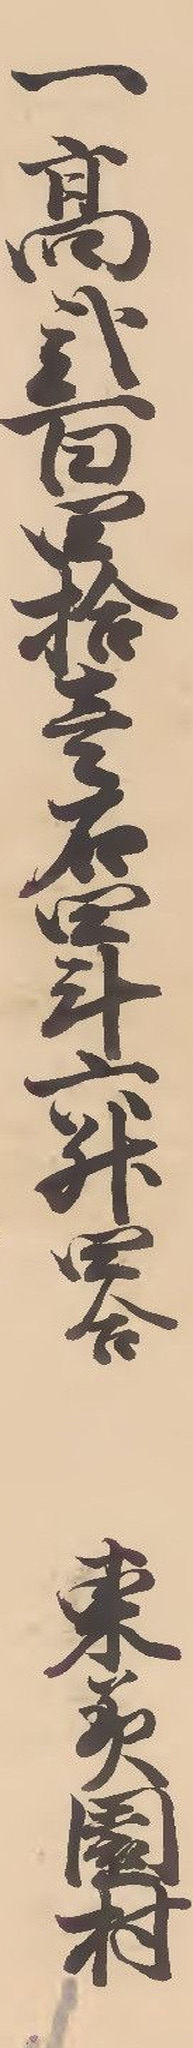一高弐百四拾壱石四斗六升四合東美園村

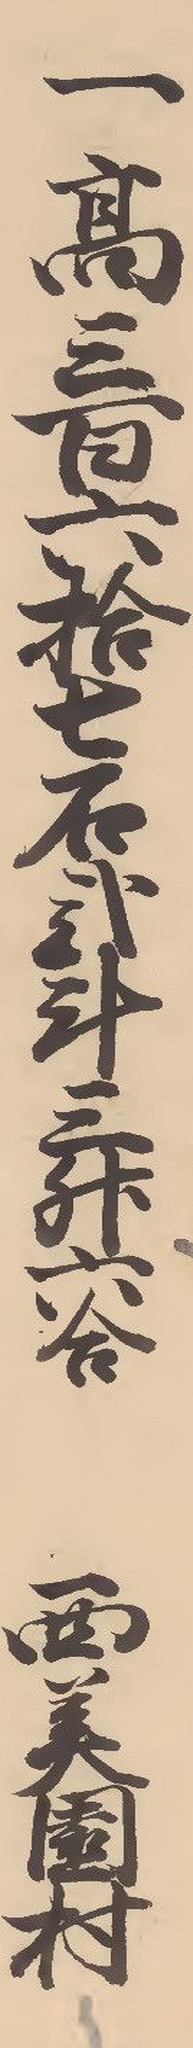一高三百六拾七石弐斗三升六合西美園村
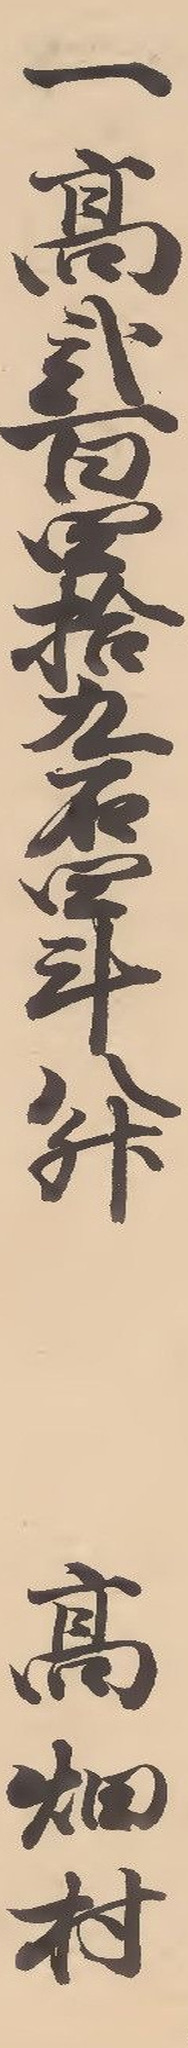一高弐百四拾九石四斗八升高畑村
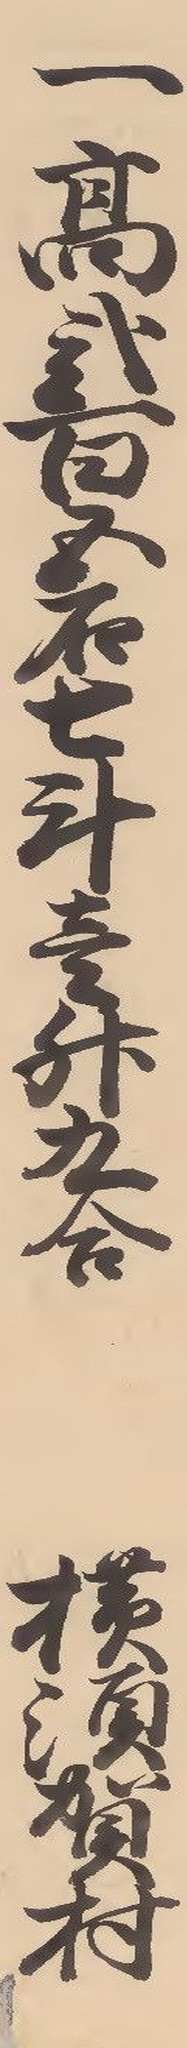一高弐百五石七斗壱升九合横須賀村
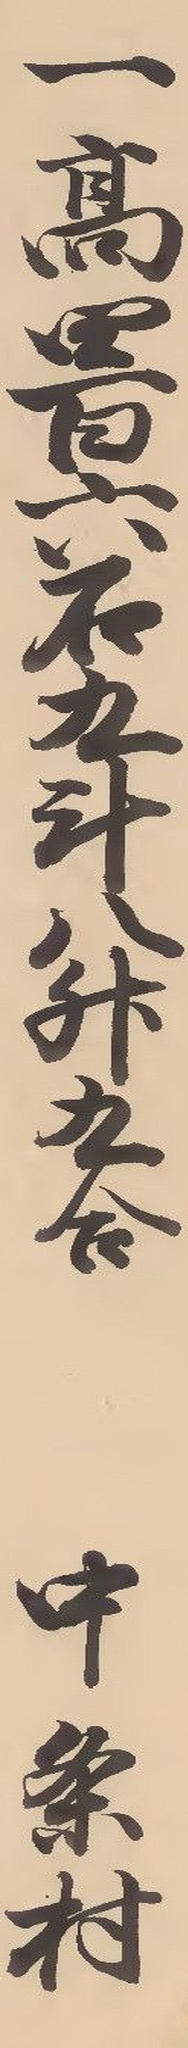一高四百六石九斗八升九合中条村
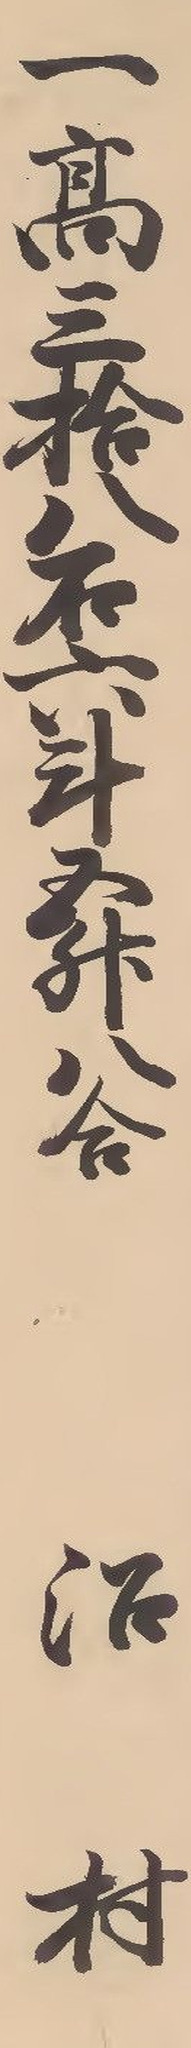一高三拾八石六斗五升八合沼村
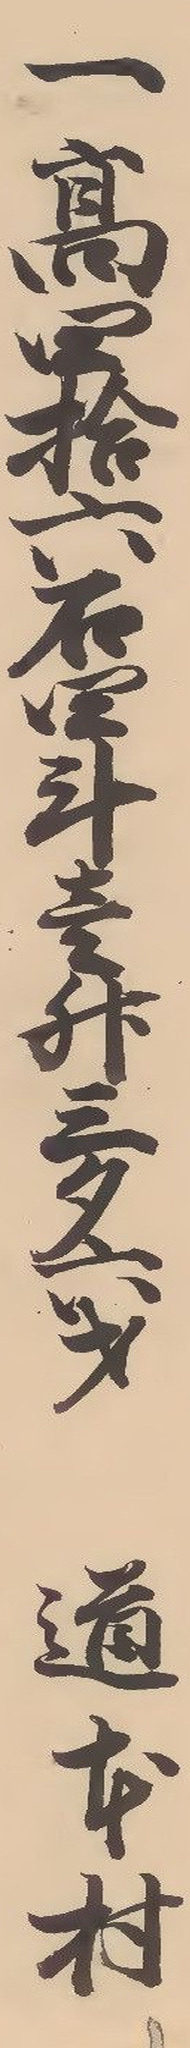一高四拾六石四斗壱升三勺六才道本村
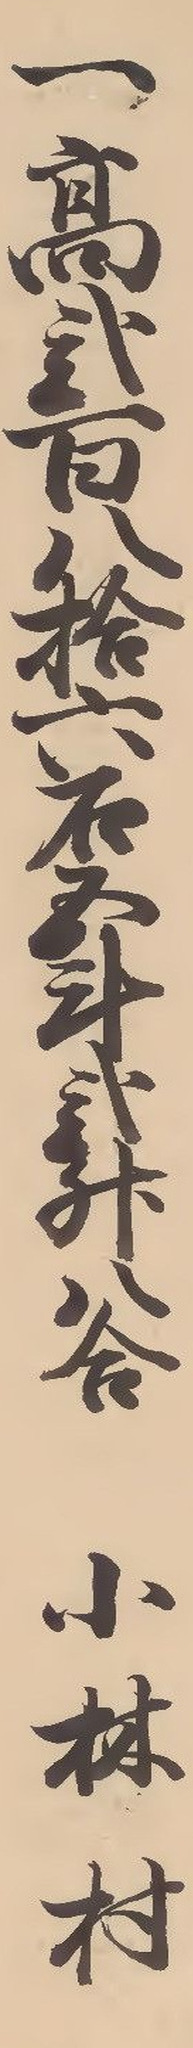一高弐百八拾六石五斗弐升八合小林村
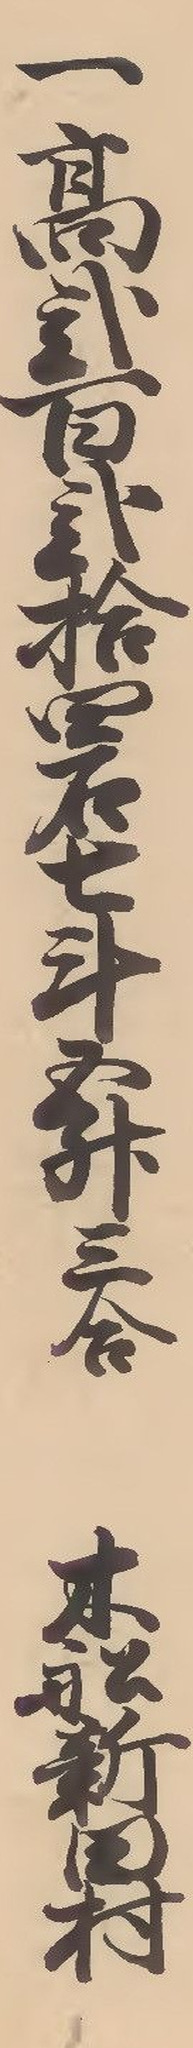一高弐百弐拾四石七斗五升三合木船新田村

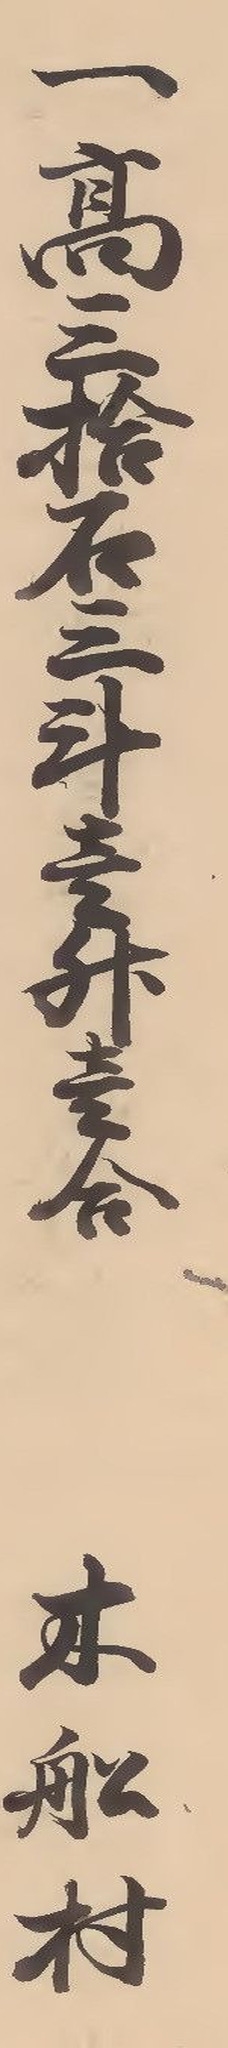一高三拾石三斗壱升壱合木船村
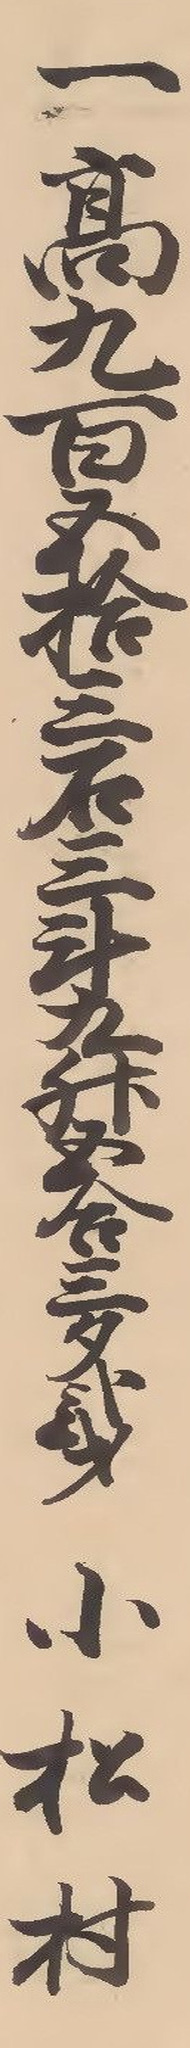一高九百五拾三石三斗九升五合三勺弐才小松村
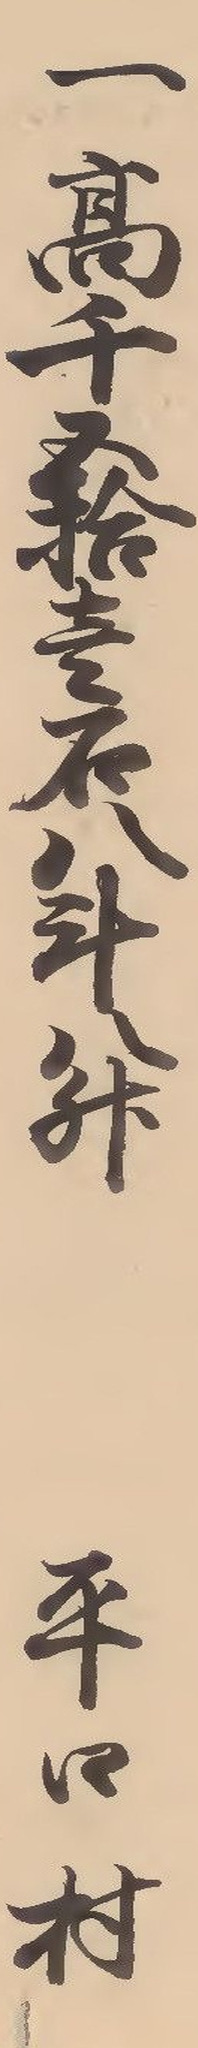一高千五拾壱石八斗八升平口村
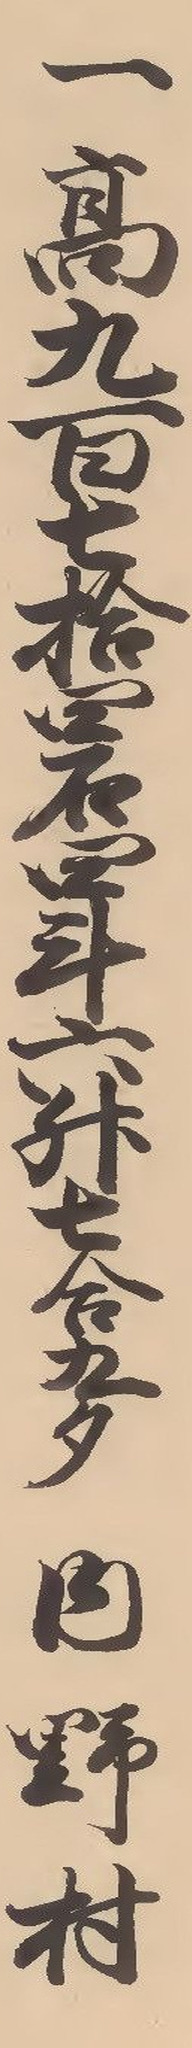一高九百七拾四石四斗六升七合九勺内野村
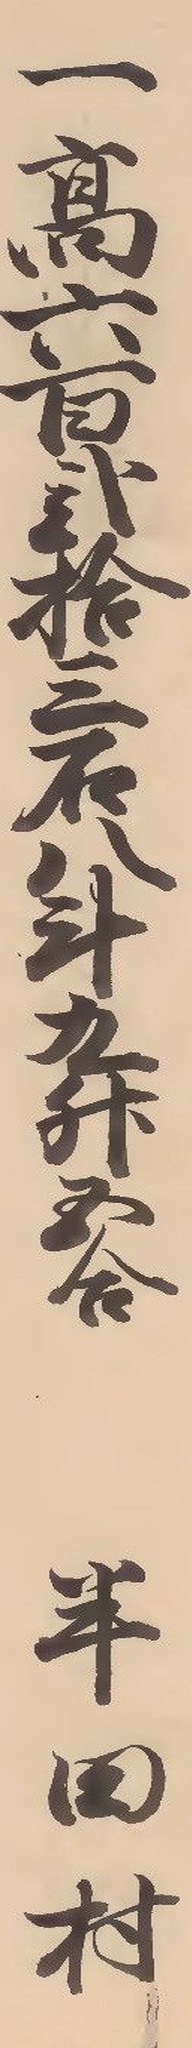一高六百弐拾三石八斗九升五合半田村
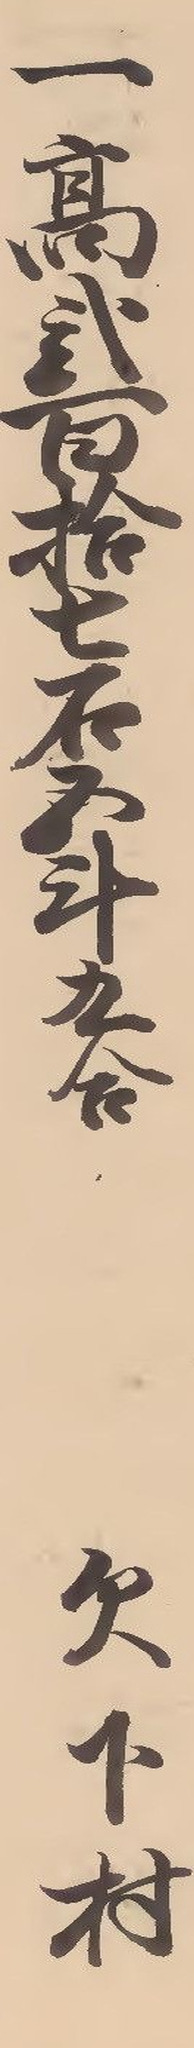一高弐百拾七石五斗九合欠下村
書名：遠江国郷帳
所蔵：国立公文書館 National Archives of Japan
